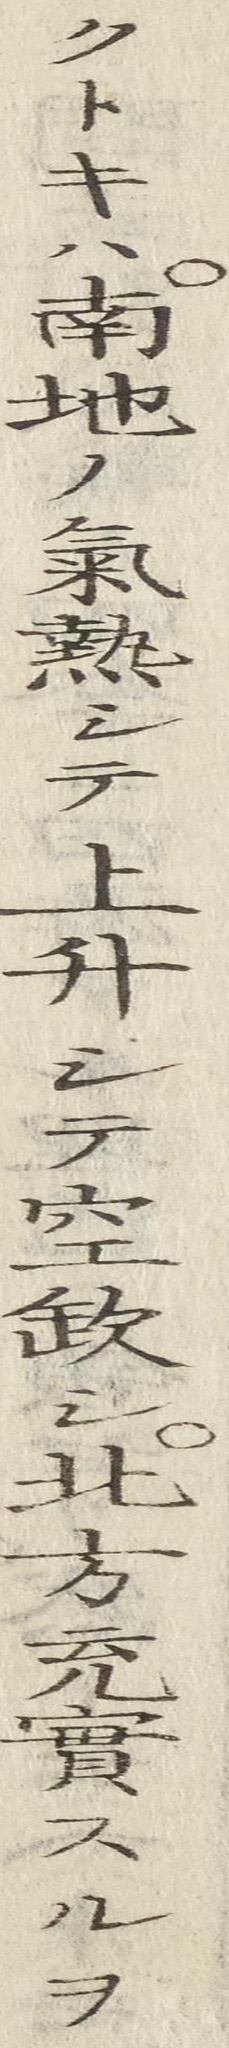クトキハ。南地ノ気熱シテ上升シテ空欫シ。北方充実スルヲ
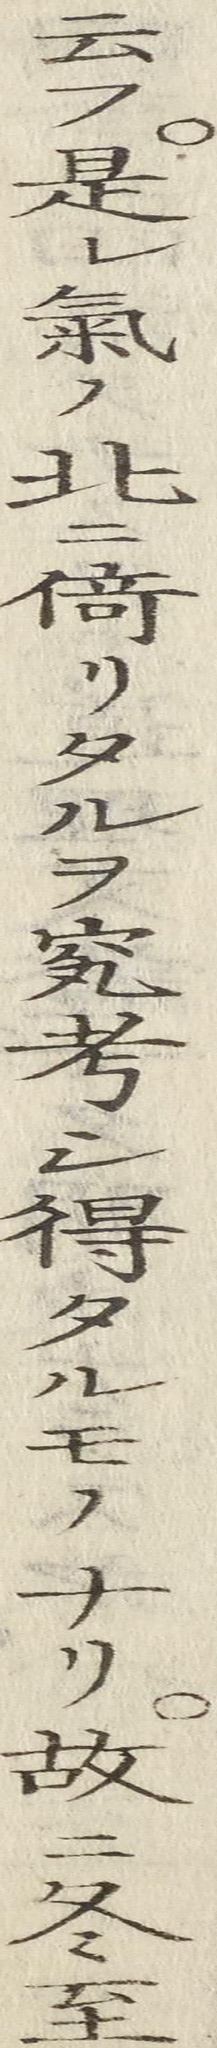云フ。是レ気ノ北ニ倚リタルヲ究考シ得タルモノナリ。故ニ冬至
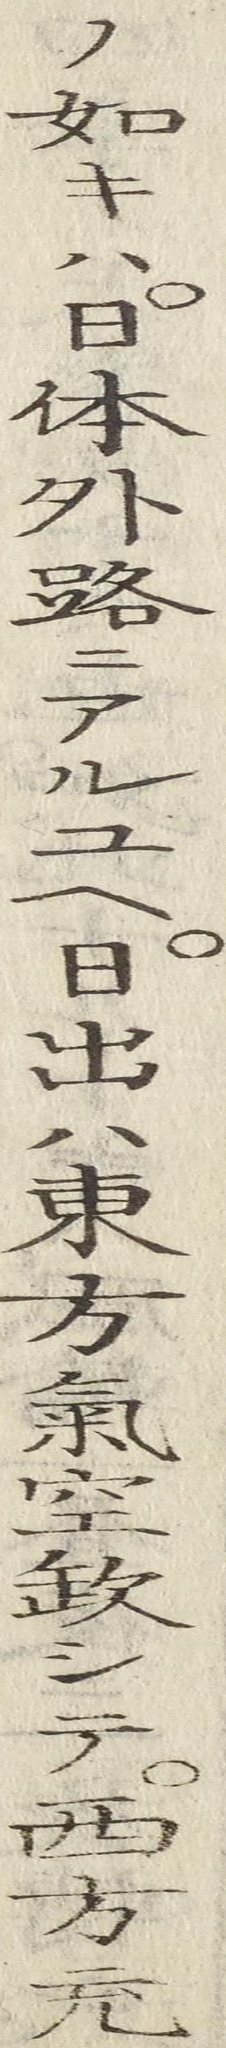ノ如キハ。日体外路ニアルユヘ。日出ハ東方気空欫シテ。西方充
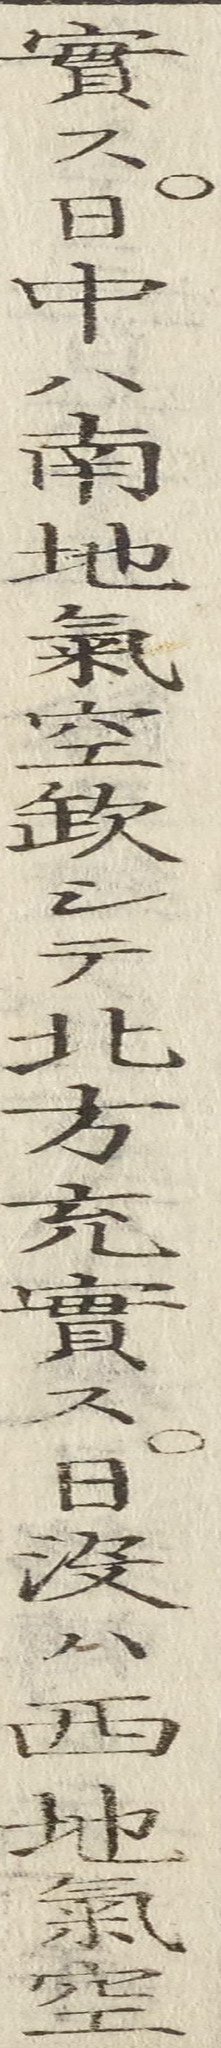実ス。日中ハ南地気空欫シテ北方充実ス。日没ハ西地気空
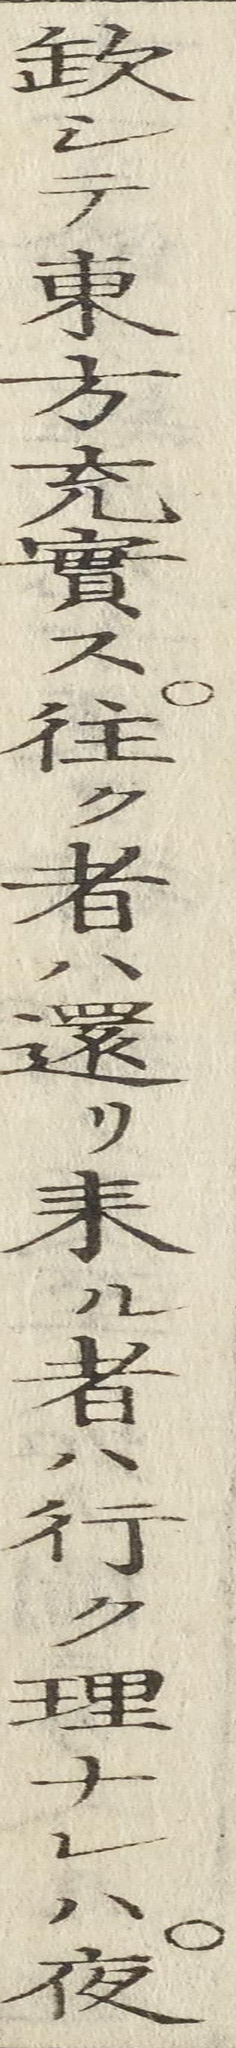欫シテ東方充実ス。往ク者ハ還リ来ル者ハ行ク理ナレハ。夜
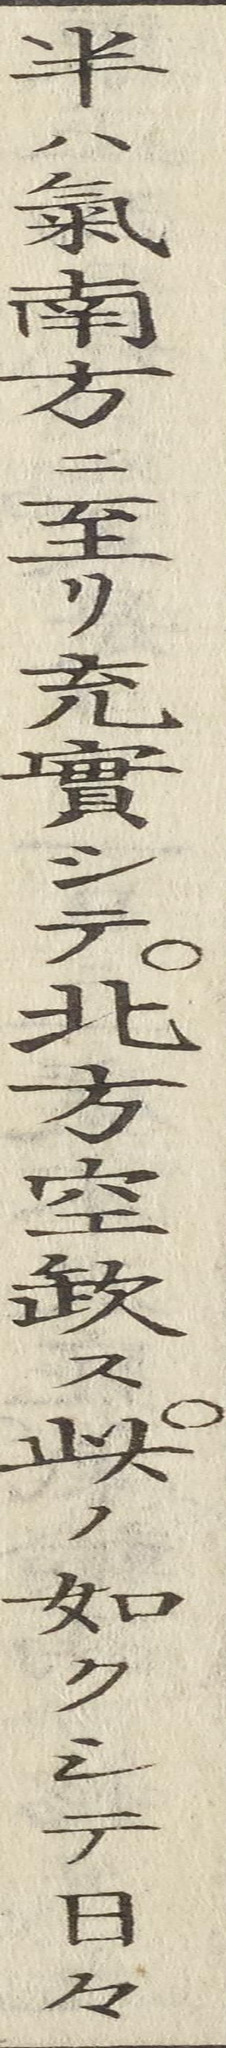半ハ気南方ニ至リ充実シテ。北方空欫ス。此ノ如クシテ日々
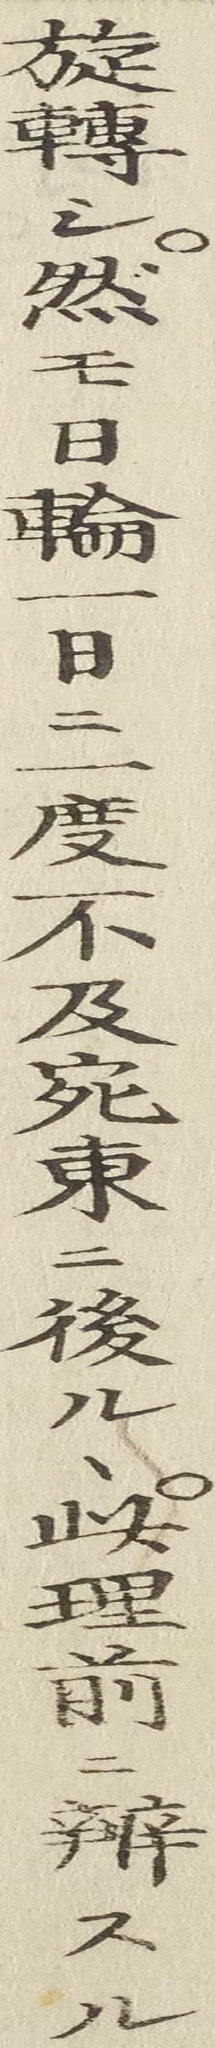旋転シ。然モ日輪一日ニ一度不及宛東ニ後ルヽ。此理前ニ弁スル
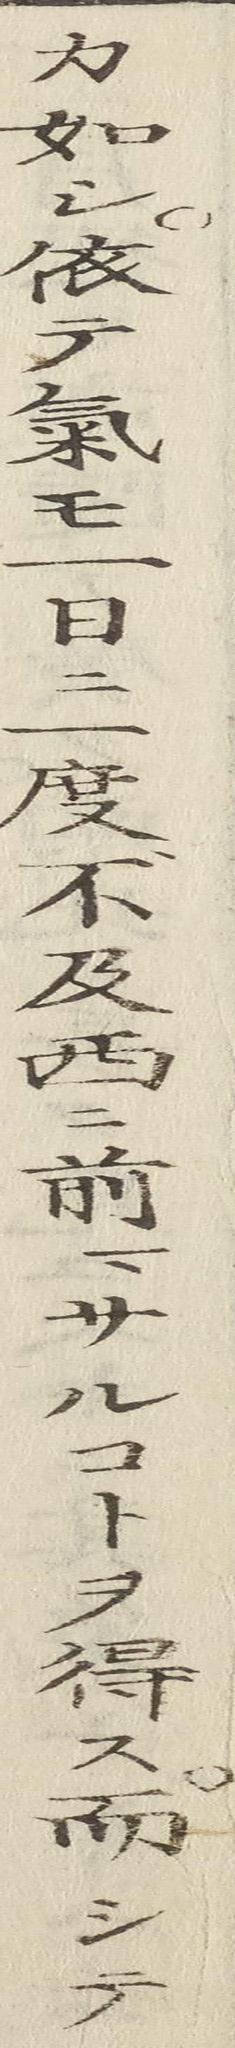カ如シ。依テ気モ一日ニ一度不及西ニ前マサルコトヲ得ス。而シテ
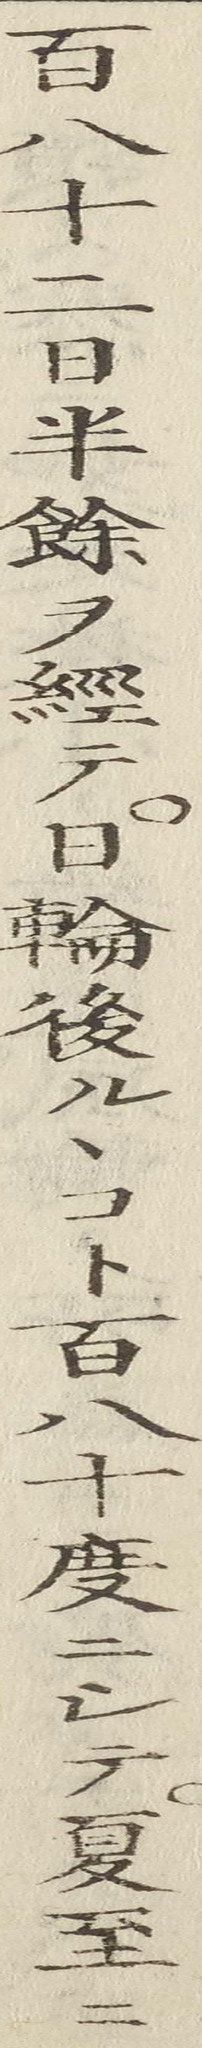百八十日半余ヲ経テ。日輪後ルヽコト百八十度ニシテ。夏至ニ
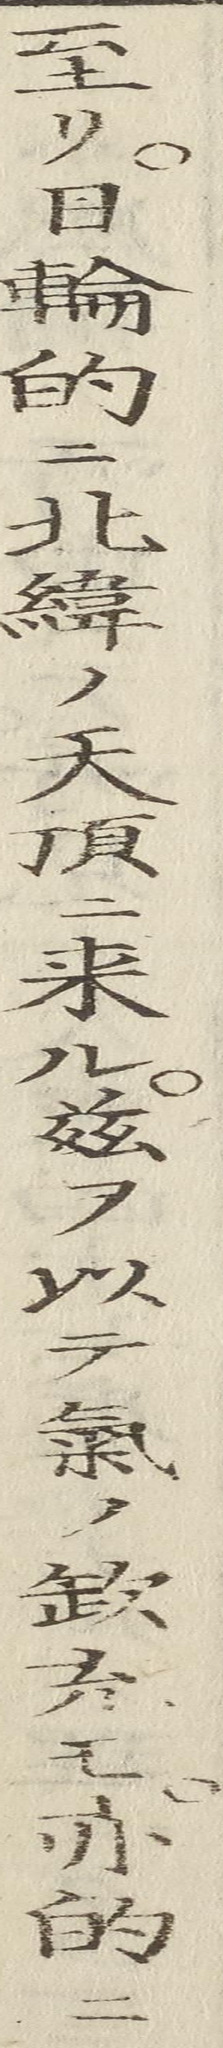至リ。日輪的ニ北緯ノ天頂ニ来ル。茲ヲ以テ気ノ欫充モ。亦的ニ
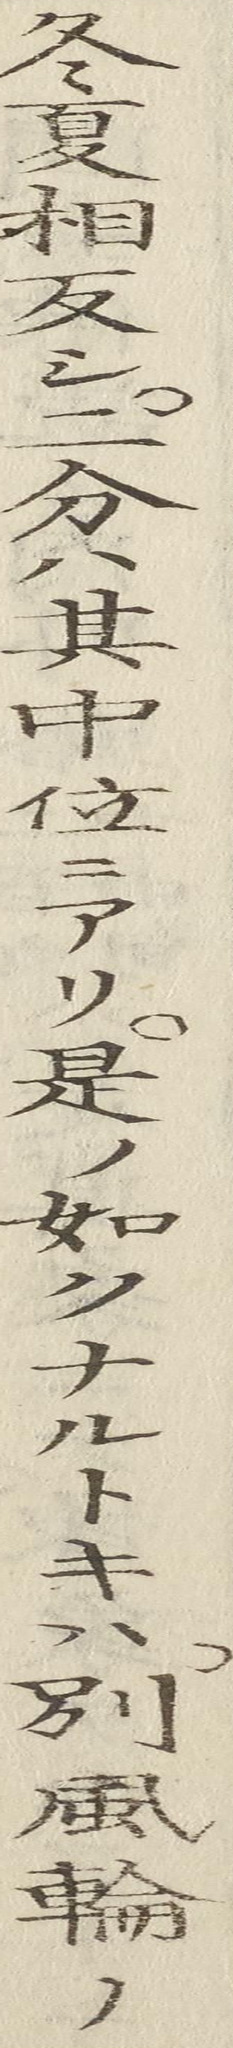冬夏相反シ。二分ハ其中位ニアリ。是ノ如クナルトキハ。別風輪ノ
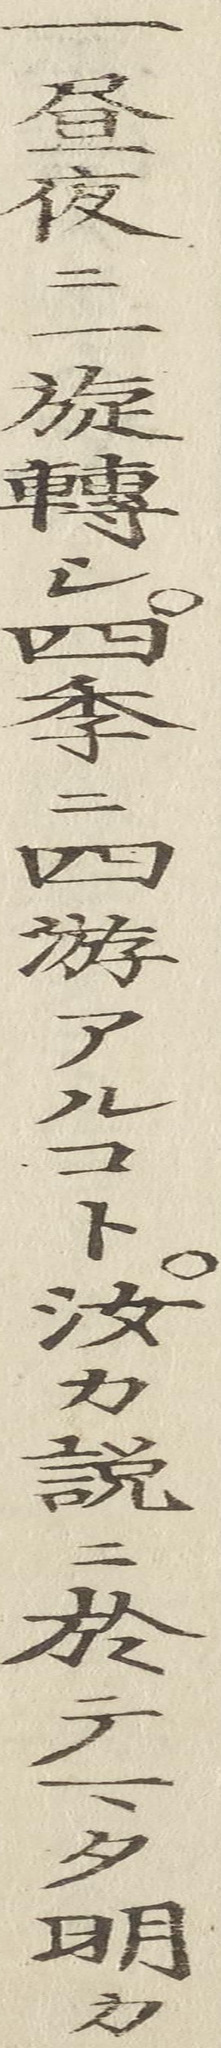一昼夜ニ一旋転シ。四季ニ四游アルコト。汝カ説ニ於テマタ明カ
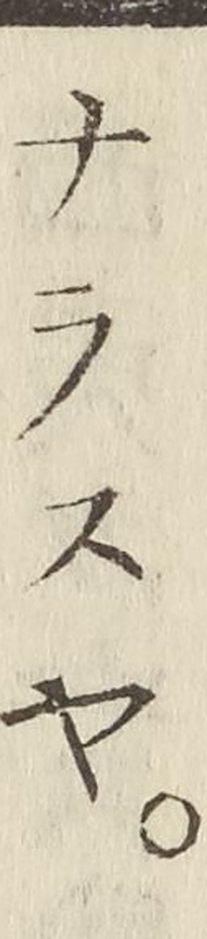ナラスヤ。
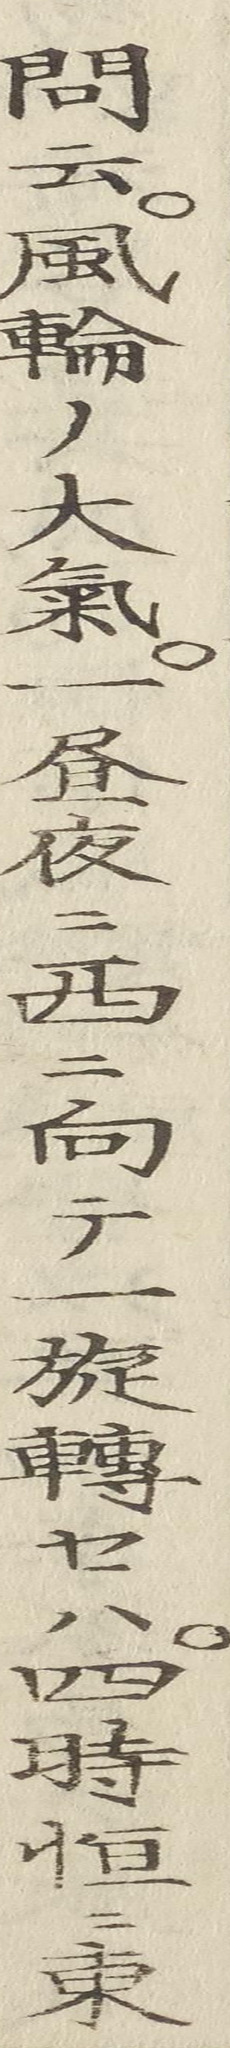問云。。風輪ノ大気。一昼夜ニ西ニ向テ一銭セハ。四時恒ニ東
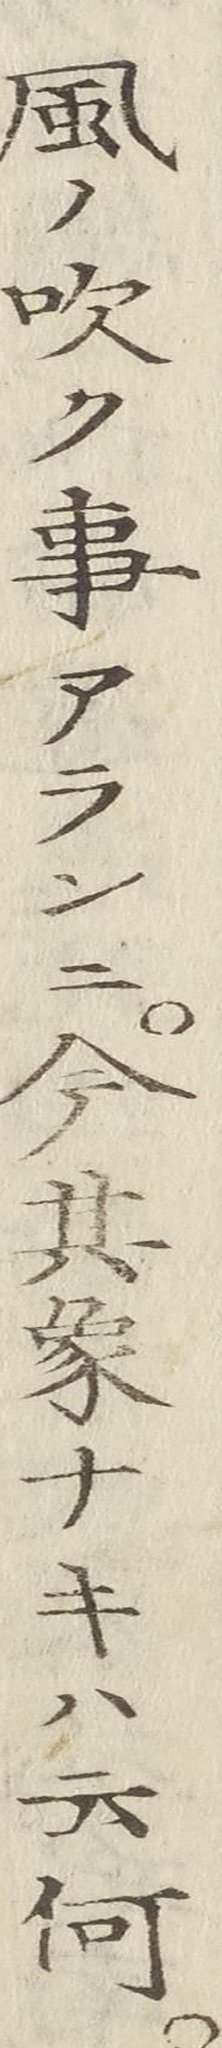風ノ吹ク事アランニ。今其象ナキハ云何。
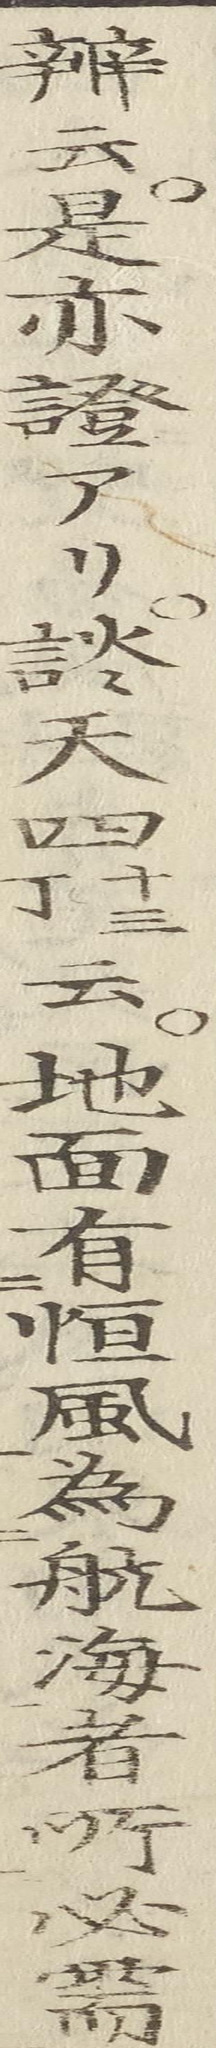弁云。是亦証アリ。談天四十三丁云。地面有ニ恒風為ニ航海者所ニ必需
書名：護法新論　二編　上
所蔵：東京大学地震研究所図書室 Earthquake Research Institute Library, The University of Tokyo, JAPAN
